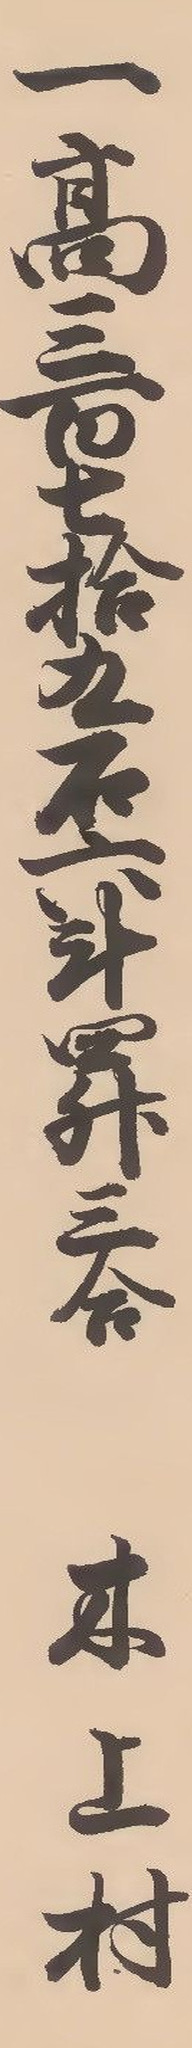一高三百七拾九石六斗四升三合木上村
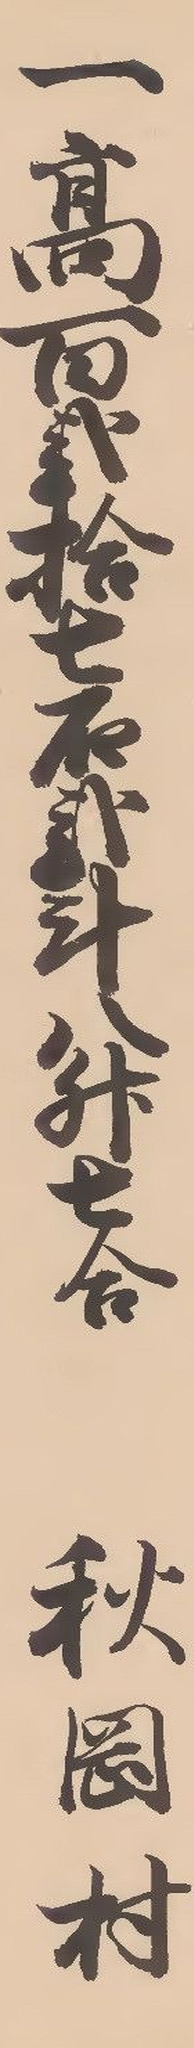一高百弐拾七石弐斗八升七合秋岡村
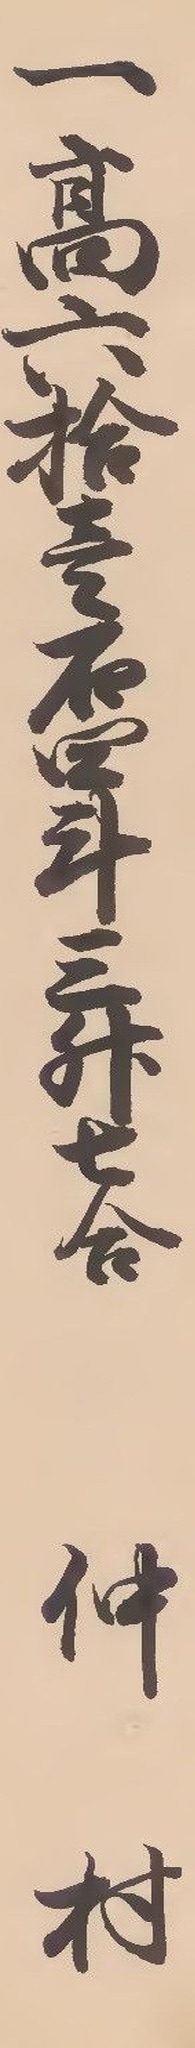一高六拾壱石四斗三升七合仲村

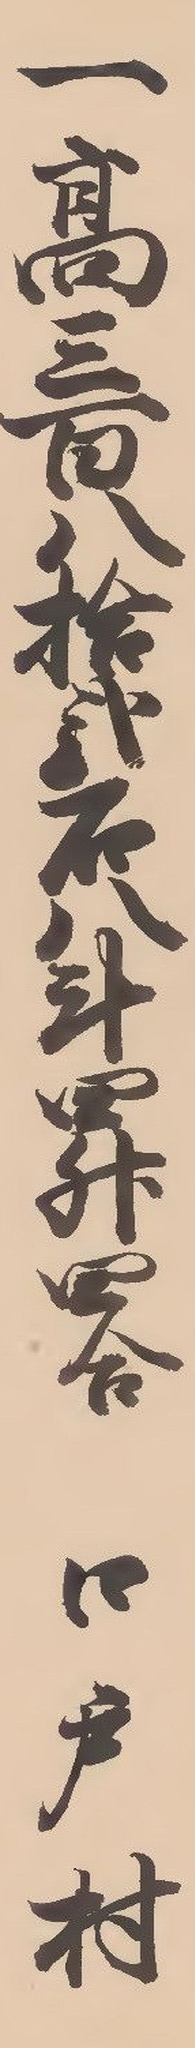一高三百八拾弐石八斗四升四合口戸村
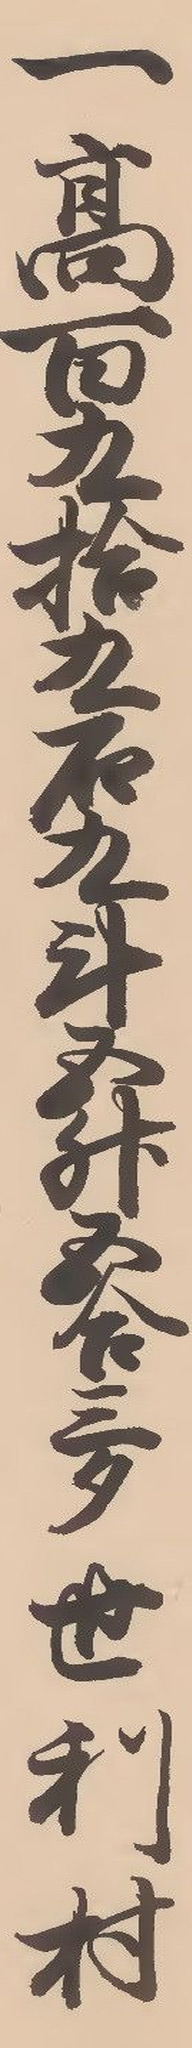一高百九拾九石九斗五升五合三勺世利村
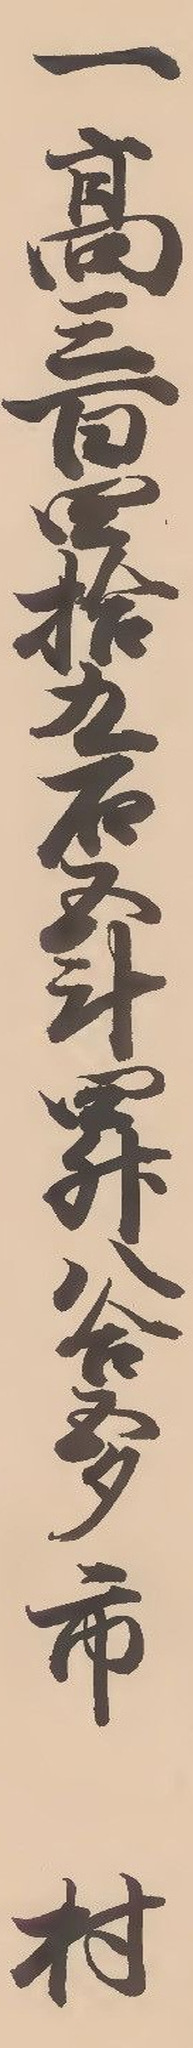一高三百四拾九石五斗四升八合五勺市村
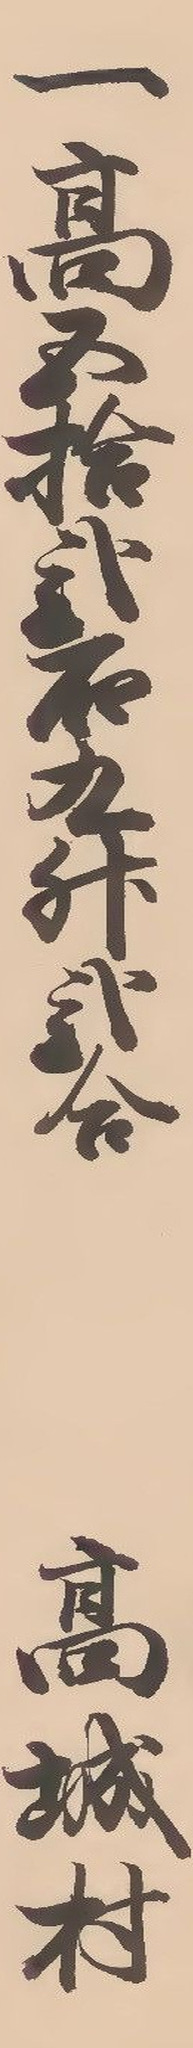一高五拾弐石九升弐合高城村
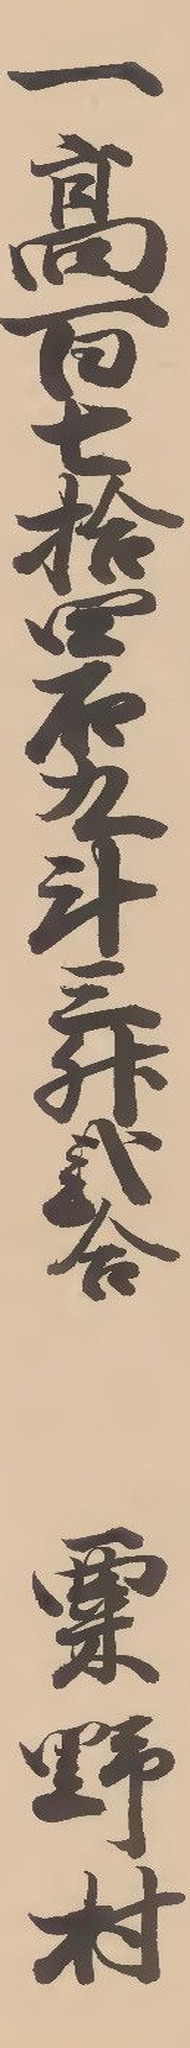一高百七拾四石九斗三升弐合粟野村
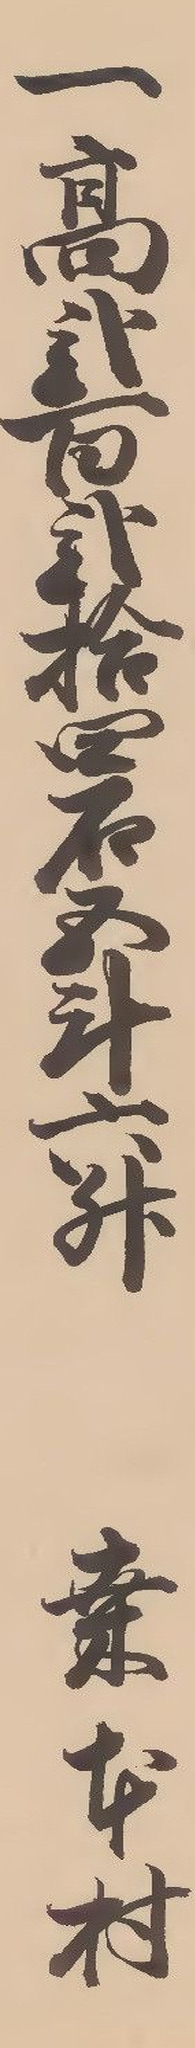一高弐百弐拾四石五斗六升桑本村
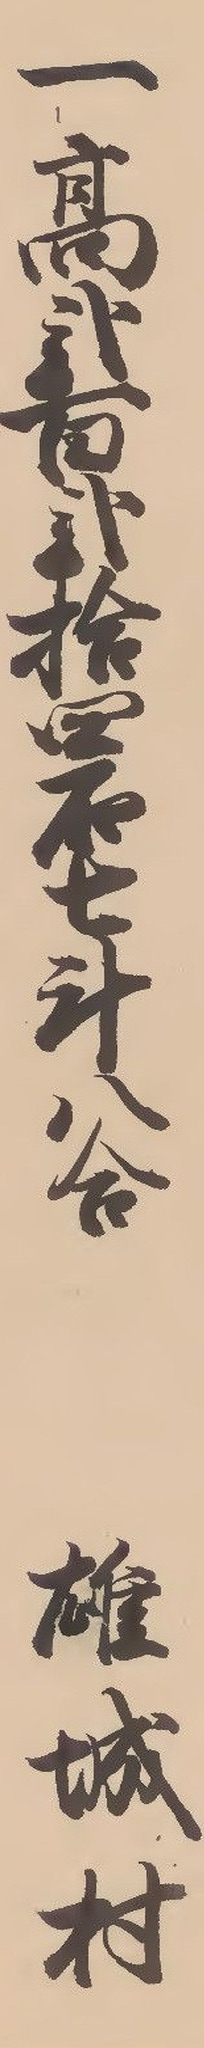一高弐百弐拾四石七斗八合雄城村
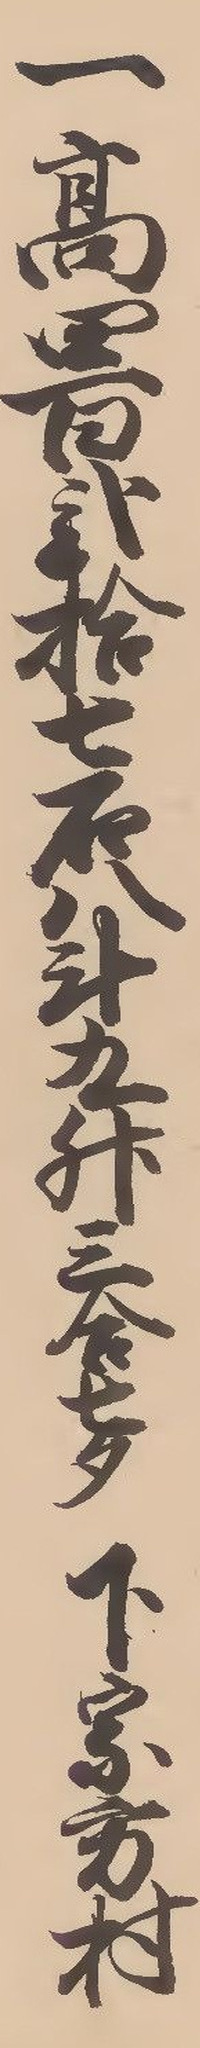一高四百弐拾七石八斗九升三合七勺下宗方村

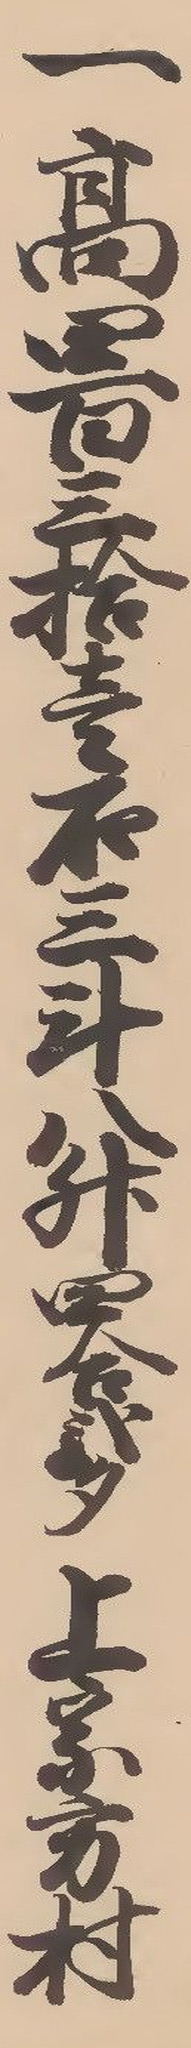一高四百三拾壱石三斗八升四合弐勺上宗方村
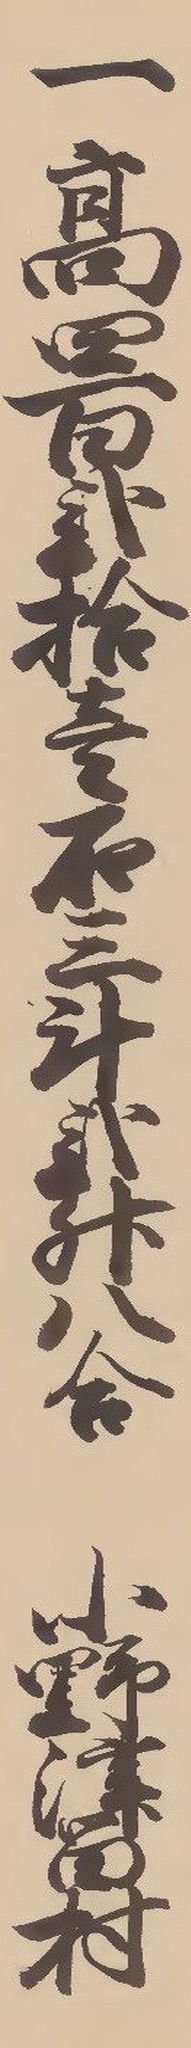一高四百弐拾壱石三斗弐升八合小野津田村
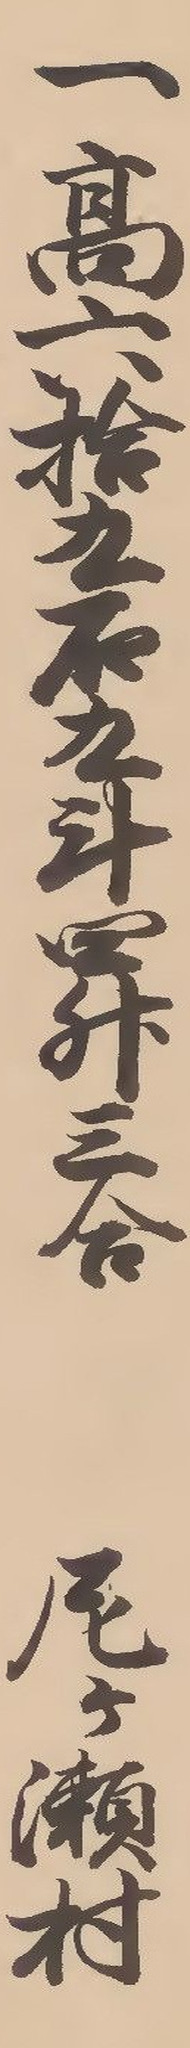一高六拾九石九斗四升三合尼ヶ瀬村
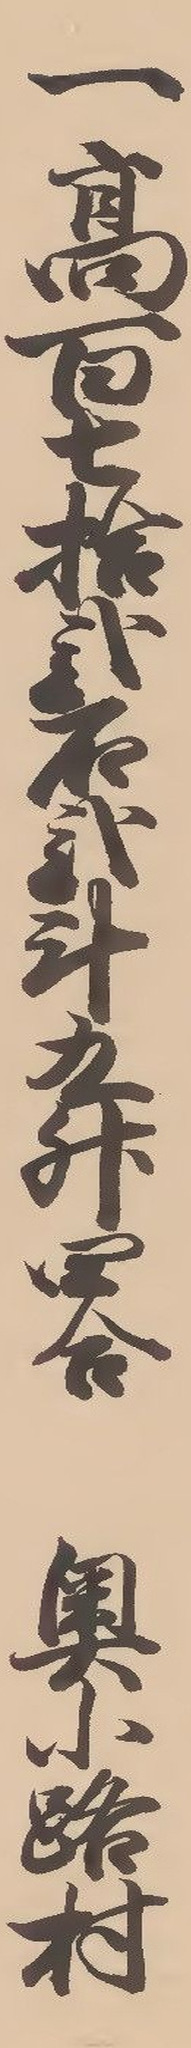一高百七拾弐石弐斗九升四合奥小路村
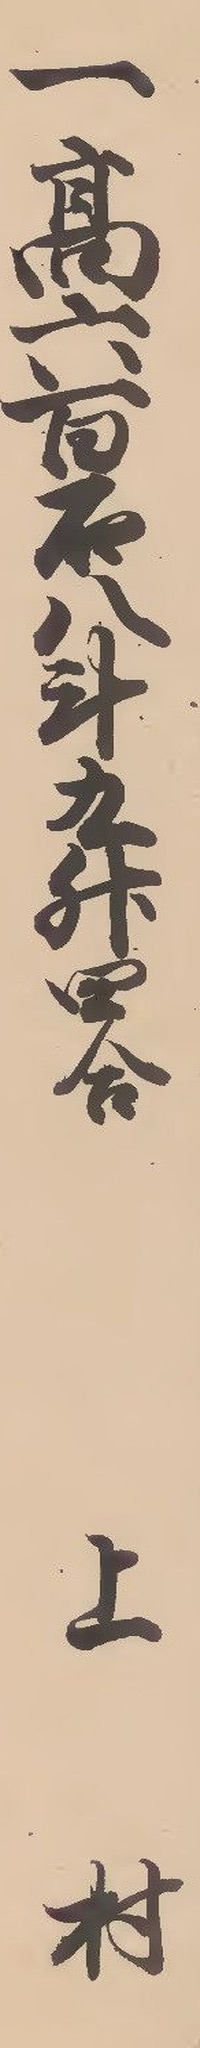一高六百石八斗九升四合上村
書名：豊後国郷帳
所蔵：国立公文書館 National Archives of Japan
